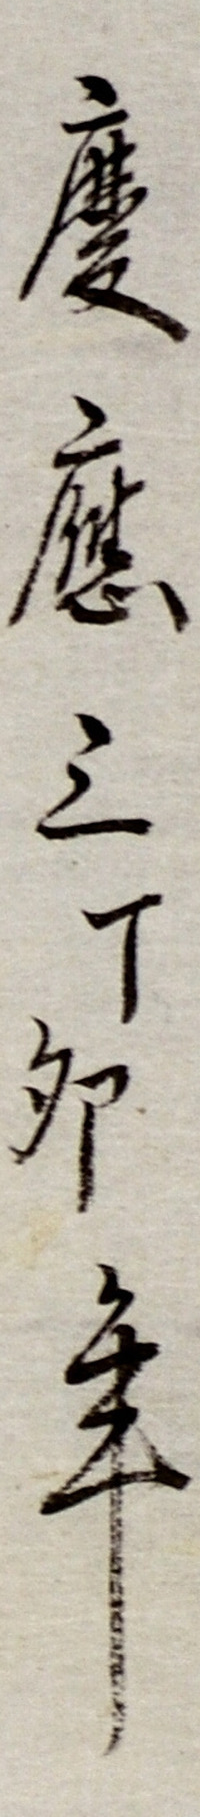慶応三丁卯年
